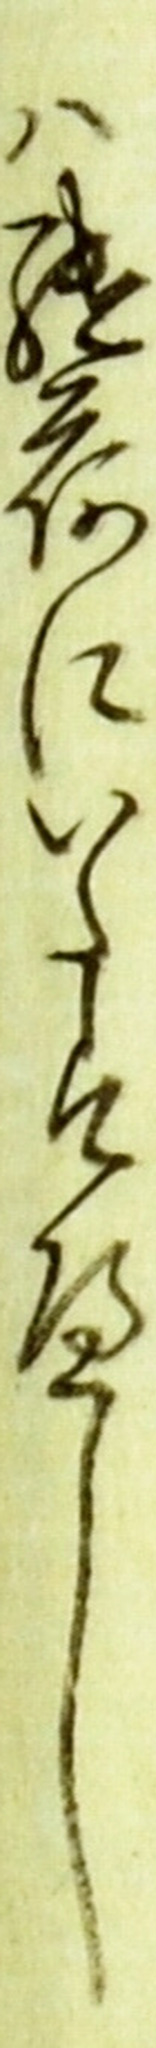ハ継荷にいたすへし
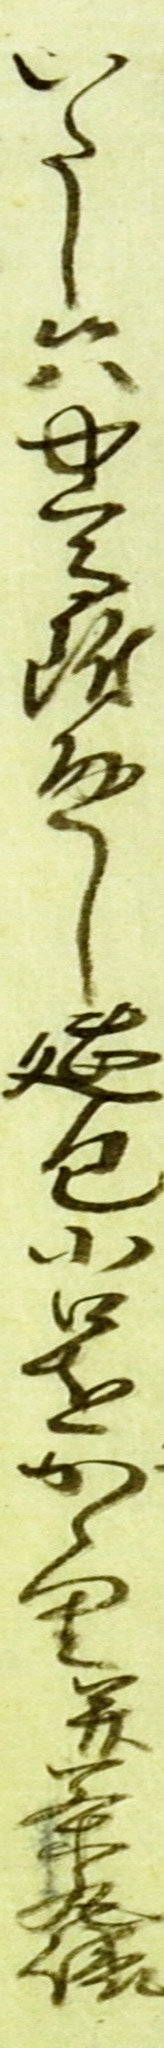いたし候ハ中馬附へし莚包小口をかゝり并茶丸俵

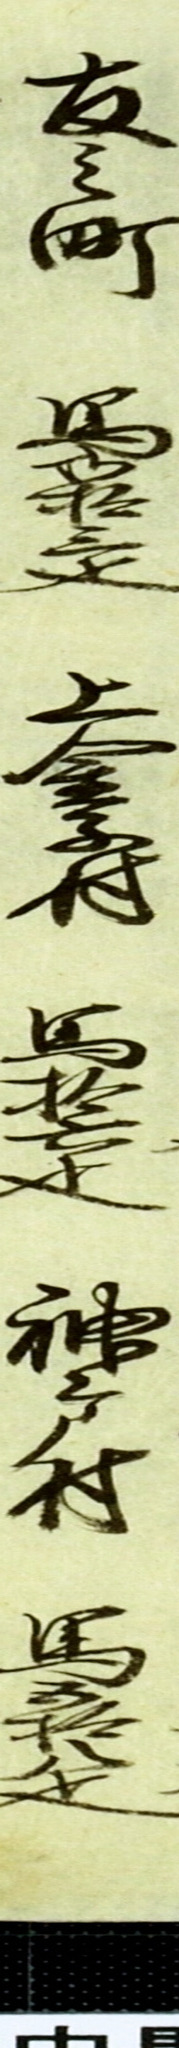友之町馬弐拾三疋上金子村馬拾六疋神戸村馬五拾八疋
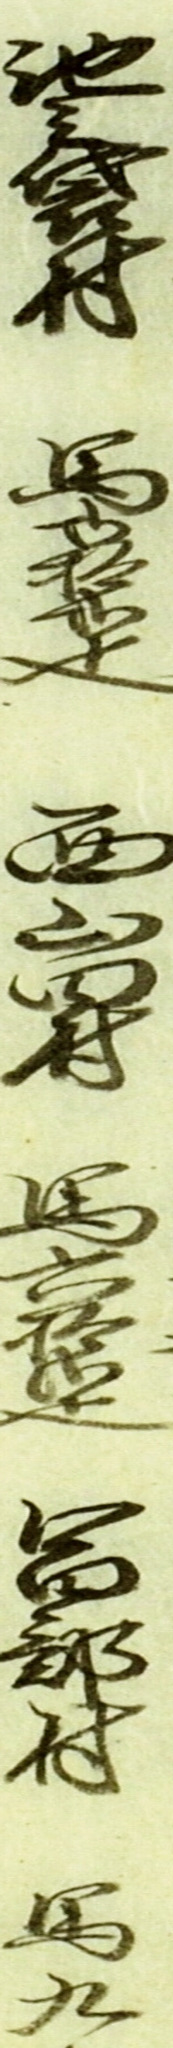池之袋村馬弐拾弐疋西山田村馬六拾弐疋冨部村馬九疋
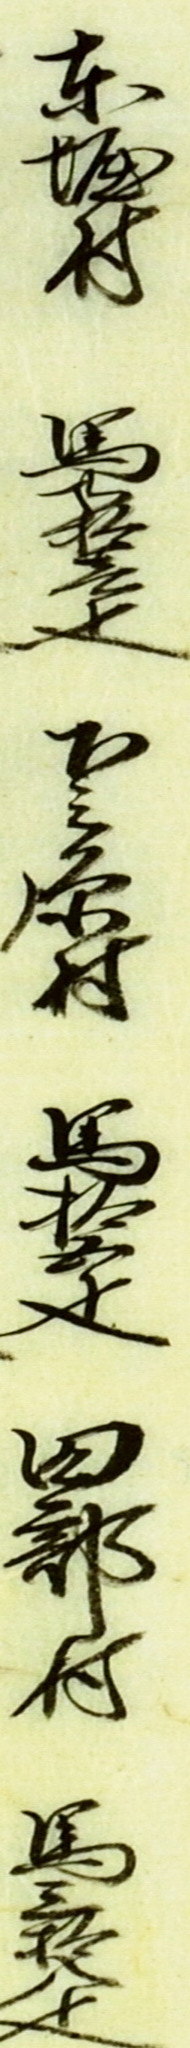東堀村馬弐拾壱疋下之原村馬拾五疋田部村馬三拾八疋
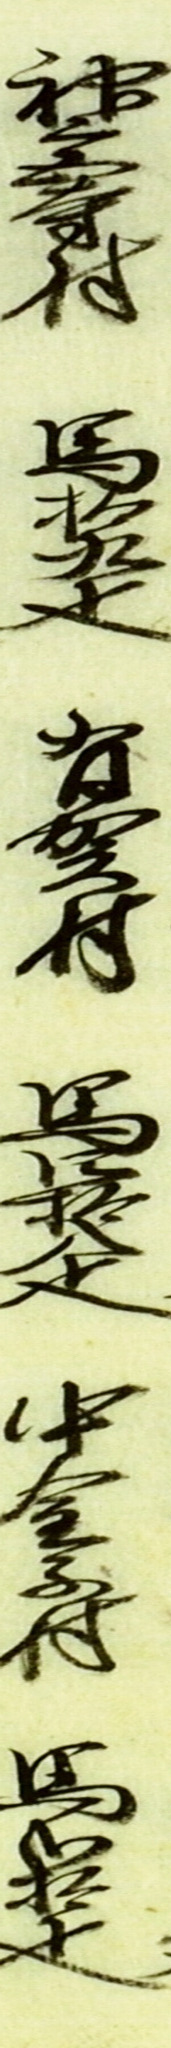神宮寺村馬拾九疋有賀村馬四拾八疋中金子村馬弐拾疋
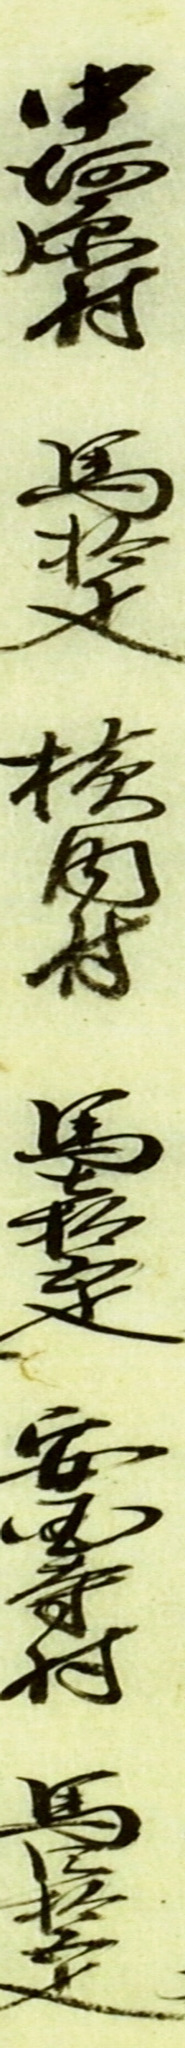中河原村馬拾疋横内村馬七拾五疋安国寺村馬四拾五疋
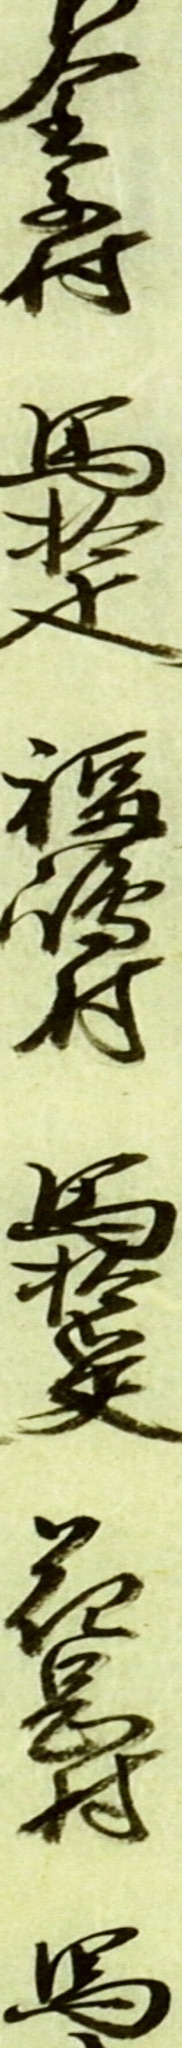下金子村馬拾疋福嶋村馬拾弐疋花岡村馬八疋
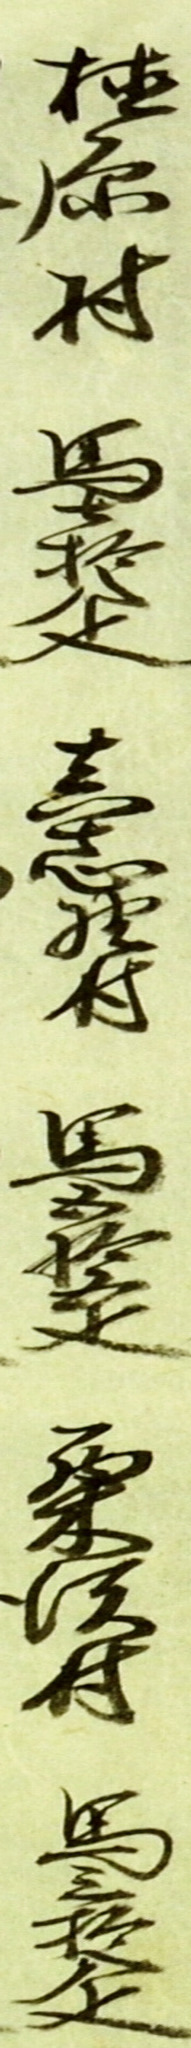植原村馬七拾八疋真志野村馬五拾五疋栗沢村馬三拾八疋

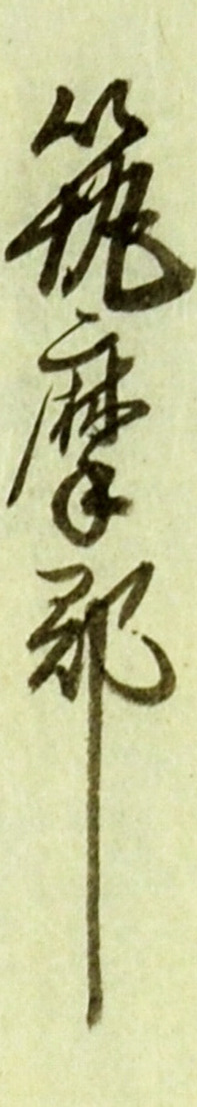筑摩郡
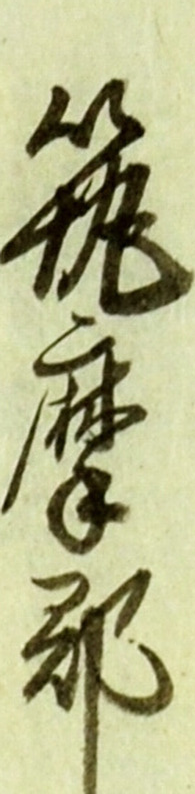筑摩郡
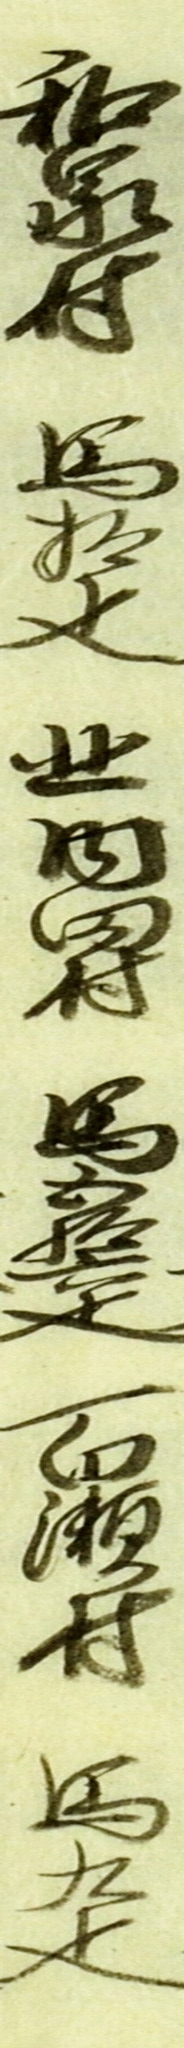和泉村馬拾疋北内田村馬五拾六疋百瀬村馬九疋
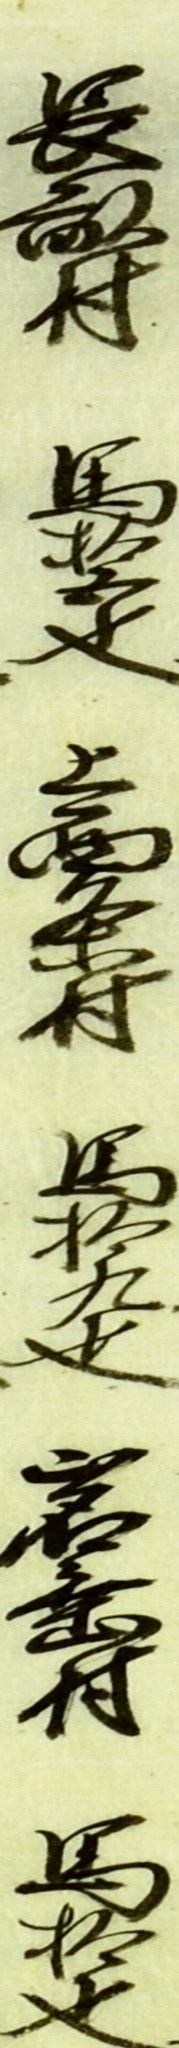長畝村馬拾五疋上西条村馬拾九疋岩垂村馬拾疋

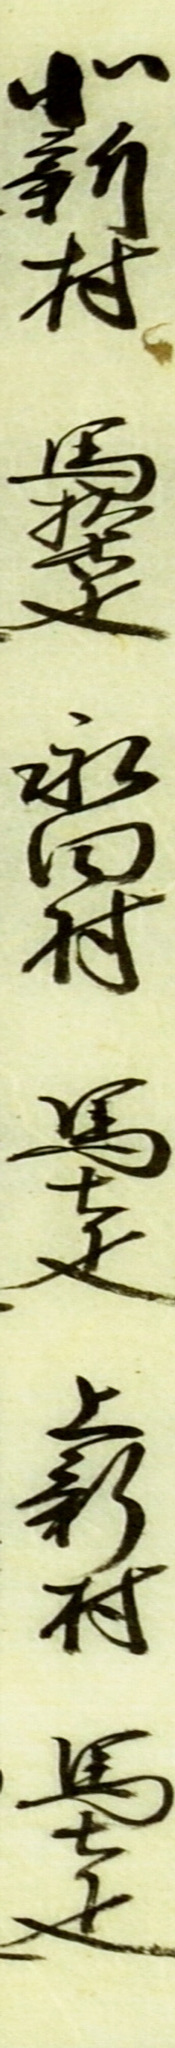北新村馬拾弐疋永田村馬七疋上新村馬七疋
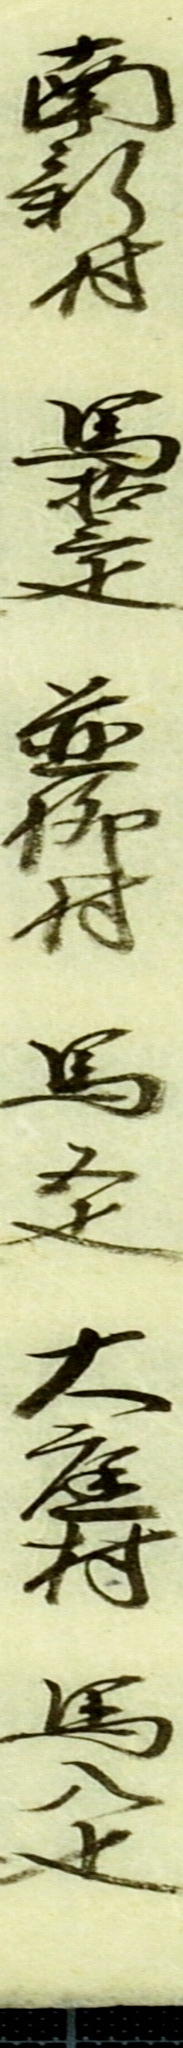南新村馬拾三疋並柳村馬五疋大庭村馬八疋
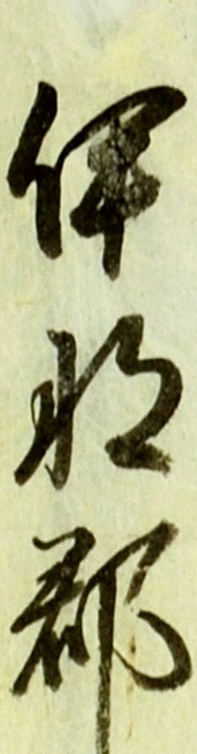伊那郡
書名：中馬荷物并口銭中馬稼之村名馬数等申渡書
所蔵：伊那市立高遠町図書館・合同会社AMANE
